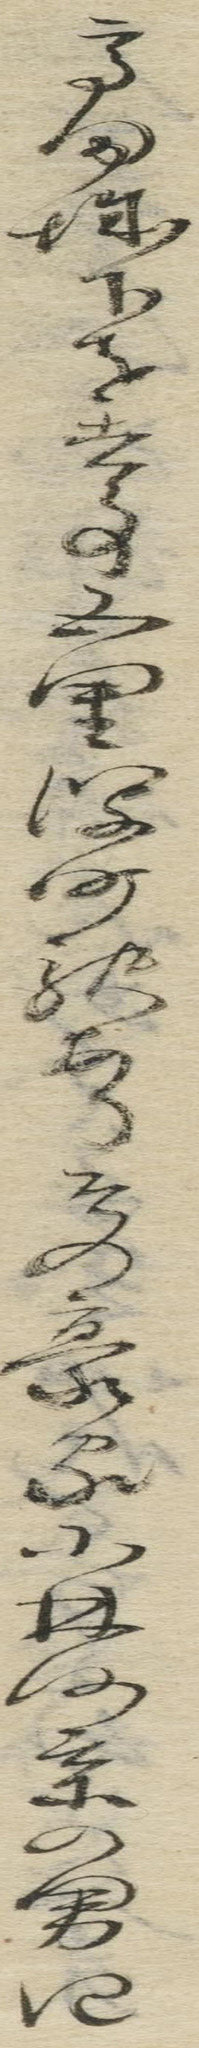高田城下を去事五里潟町駅ありその豪家小林何某の男四
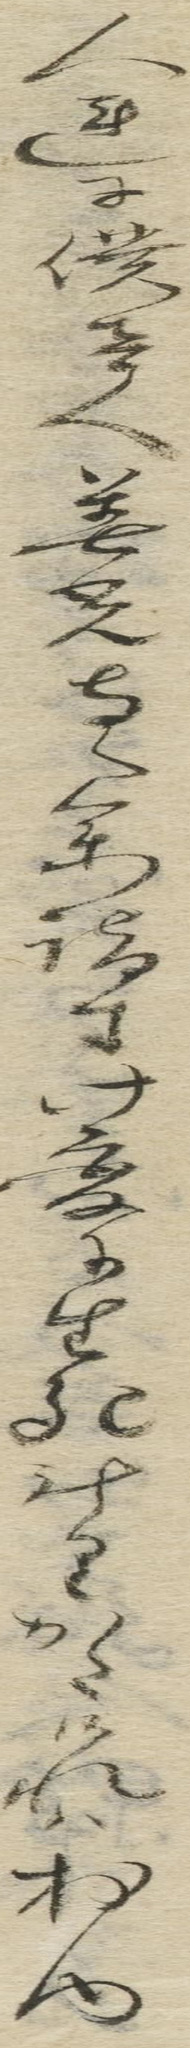人連に僕壱人善光寺へ参詣す此変に生死計りかたけれハ村内
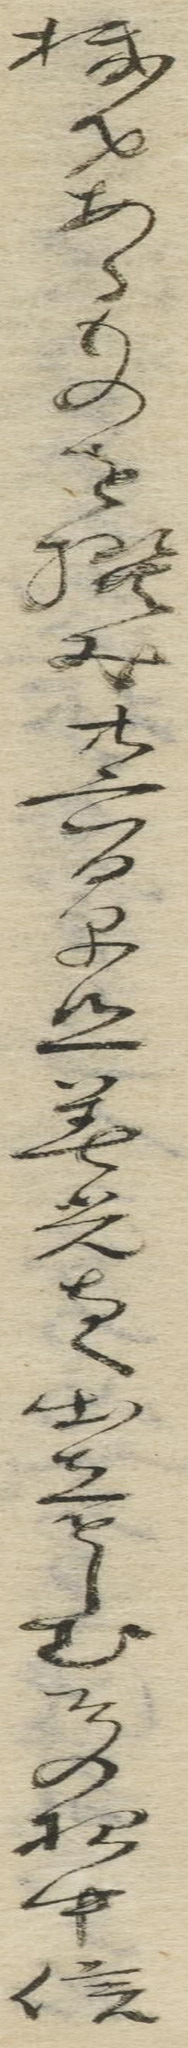機才あるものを選み廿六日早立善光寺へ出立をしむその夜中信
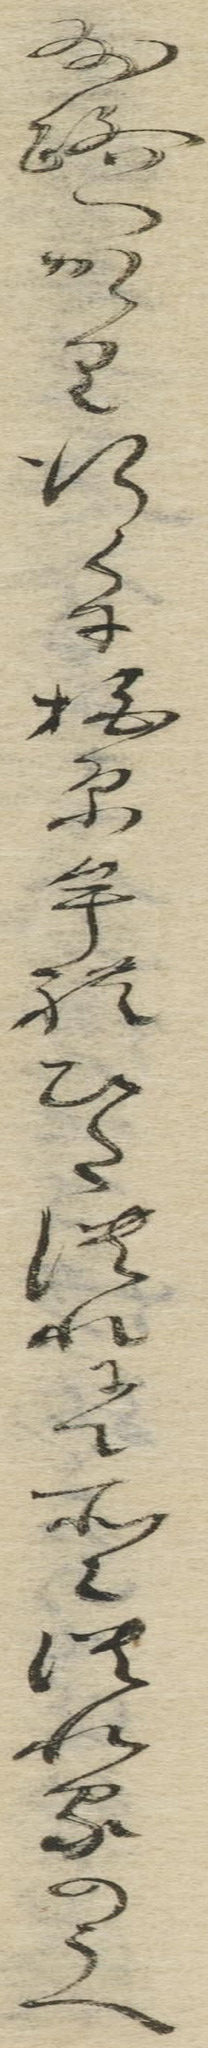州路へかゝり行くに柏原牟礼ひた潰れにて所々潰れ家のうへ
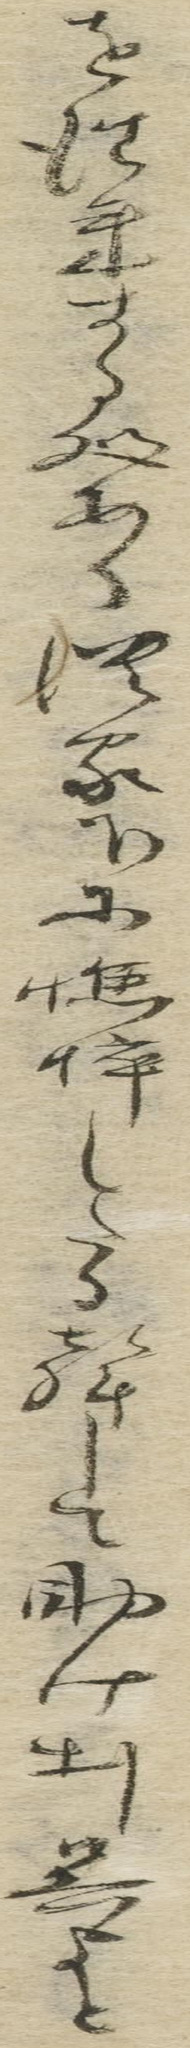を往来する処あり潰家下に憔悴したる聲して助け出し呉よと
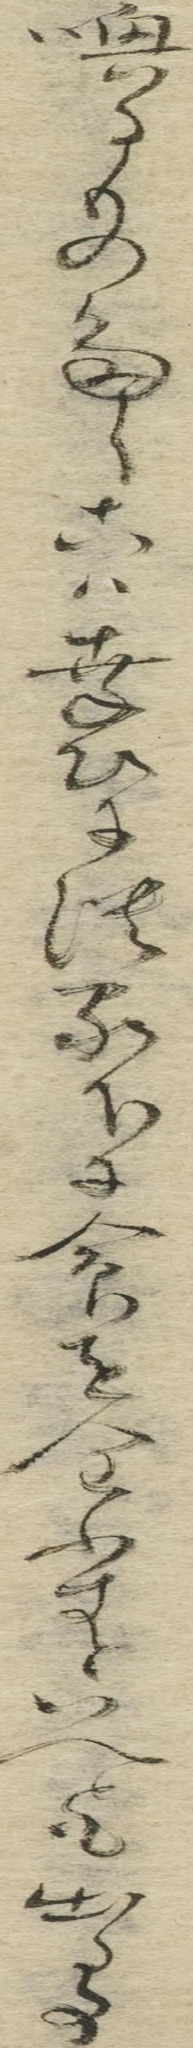喚けるもの多しこハ幸ひに潰家下に食を全ふすといへとも出る事

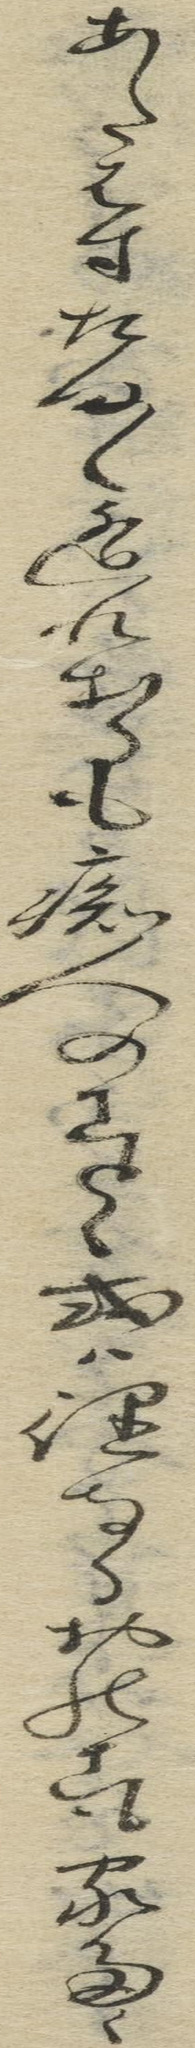あたはすたま〳〵遁れ出るも痴人のことく或ハ浬？なるおのこも家多く
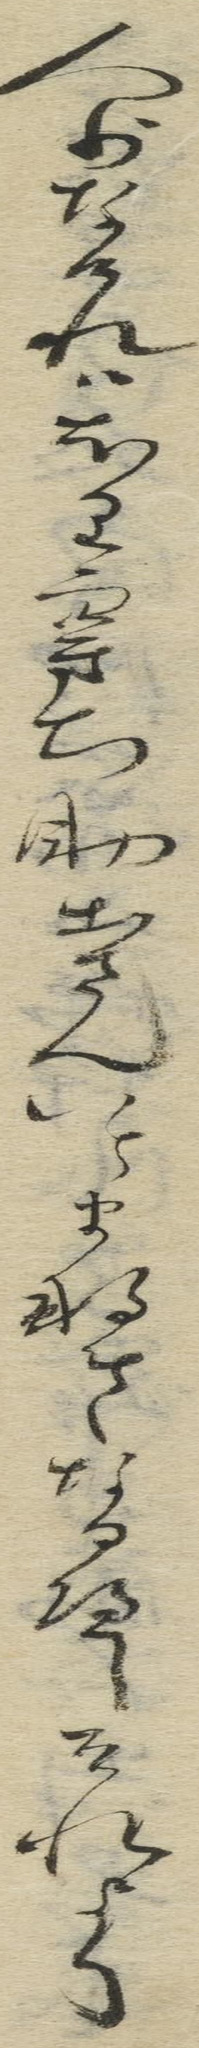人少なけれハほり穿ち助出さんいとまなきなるへしそれより
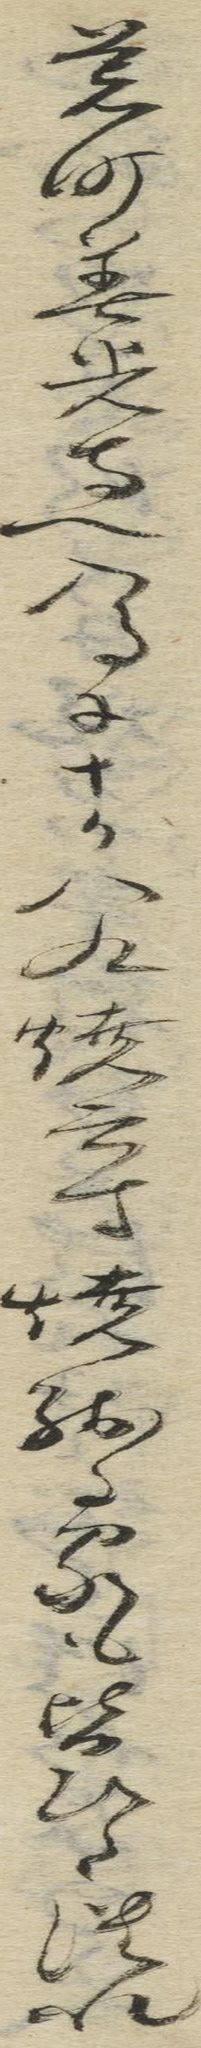荒町善光寺へ入るに十か八九焼亡す焼残る家も皆ひた潰れ
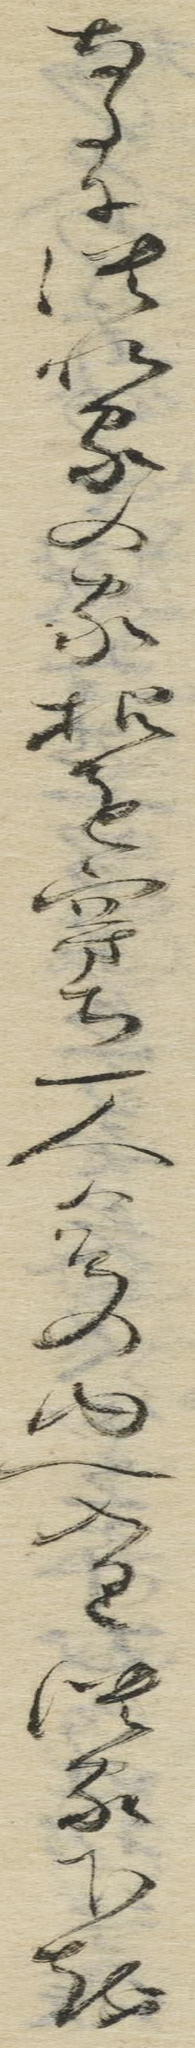なるに潰れ家の屋根を穿ち一人のもの内入り潰家下を
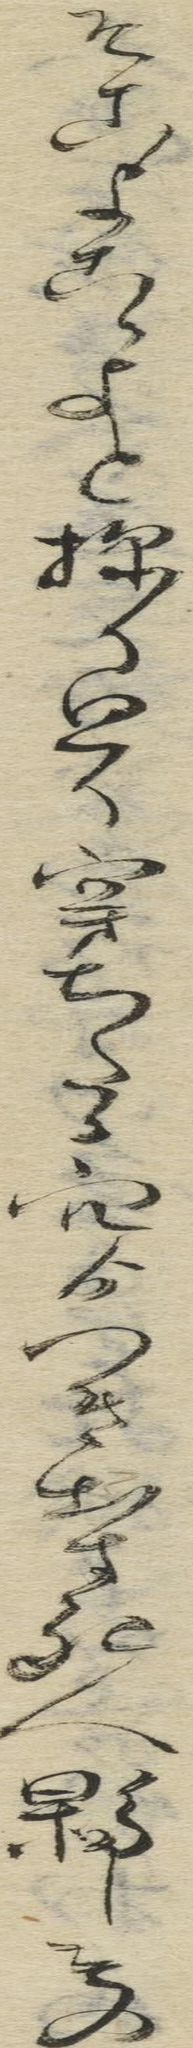そこよこゝよと探り廻り穿ちたる穴ゟつき出す死人夥しその
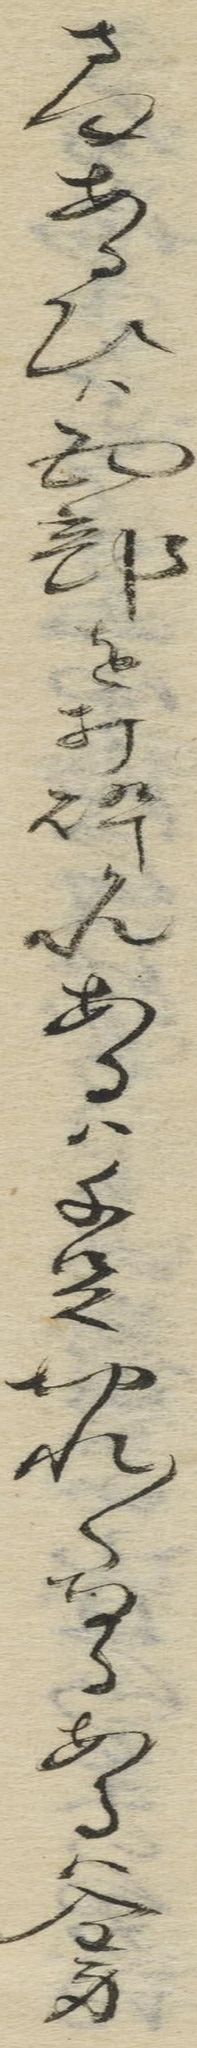さまあるひハ腰部を打砕かれあるハ手足切れ〳〵なるあるハ全身
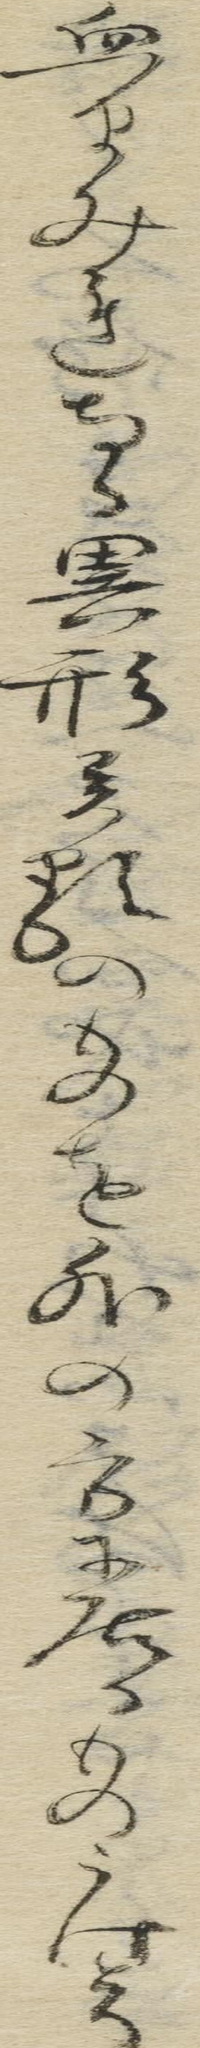血まみれなる異形異類のものを外の方に居るものうけとり
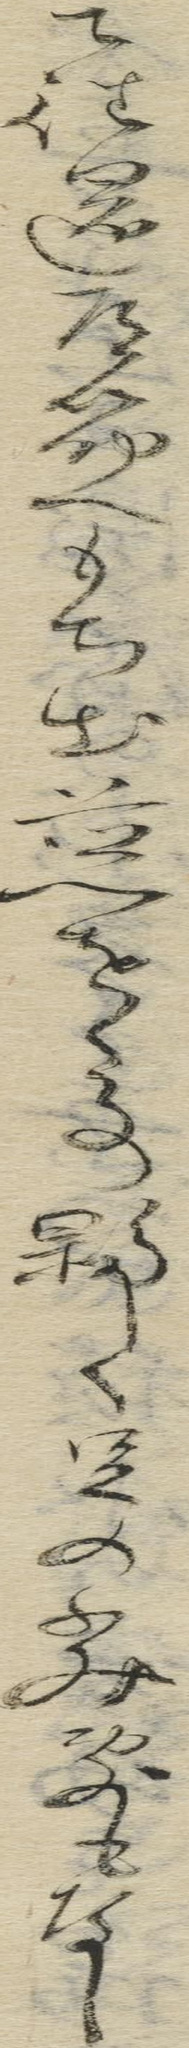て往還道筋へもち出並へをく事夥しく足のふみ処もなし
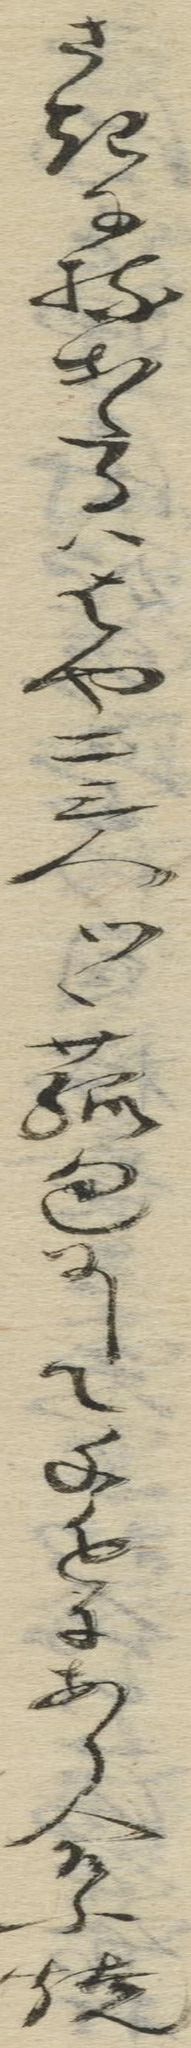さきに持出たるハはや二三人ッゝ菰包にして手近にあり今に焼
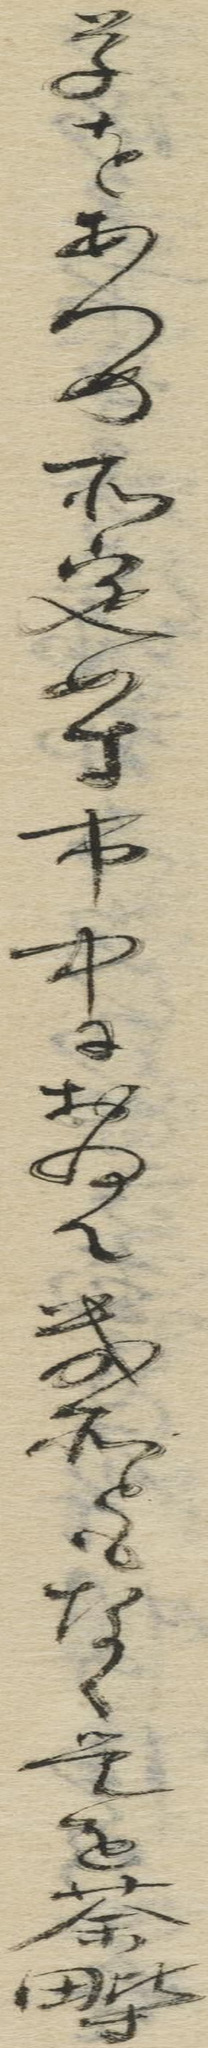草をあつめ所定めす市中におゐて幾所ともなく是を荼毘
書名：弘化丁未天變日記
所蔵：東京大学地震研究所図書室 Earthquake Research Institute Library, The University of Tokyo, JAPAN
